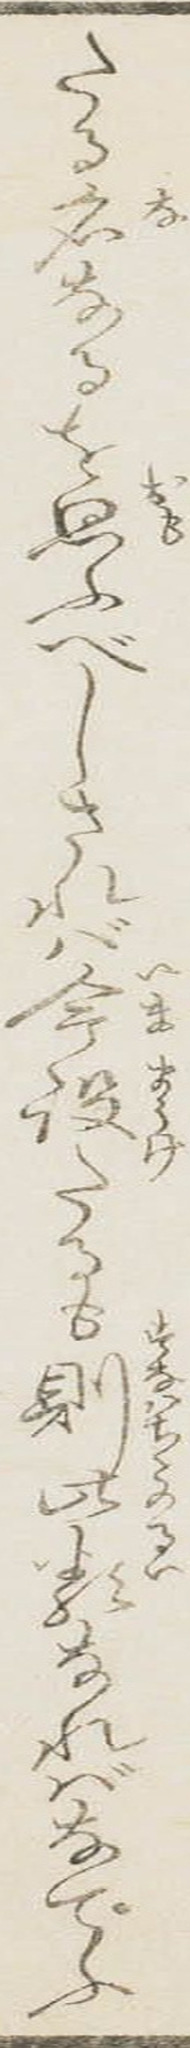たる名なるを思ふべしされば今設たるも則此類なればなでふ
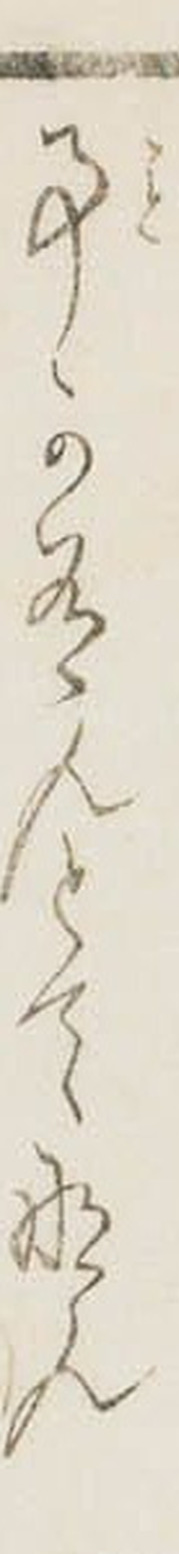事か有んとてなん
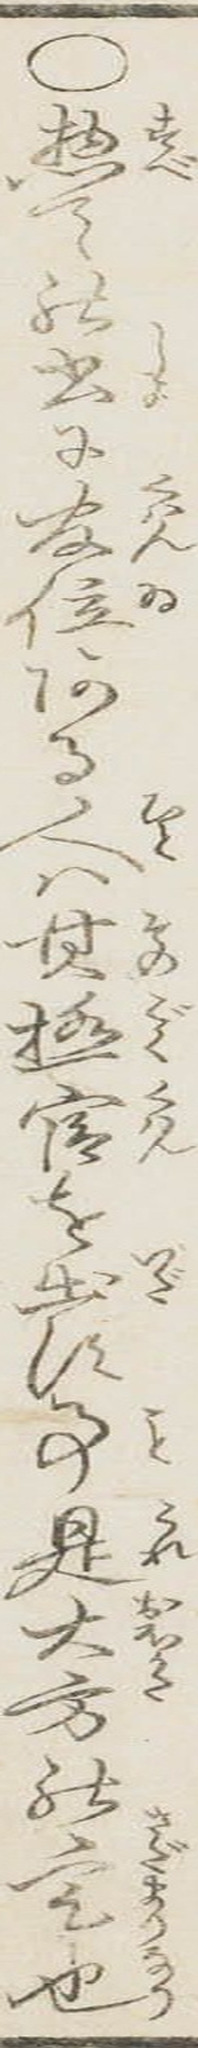○総ての書に官位ある人は其極官を出す事是大方の定也
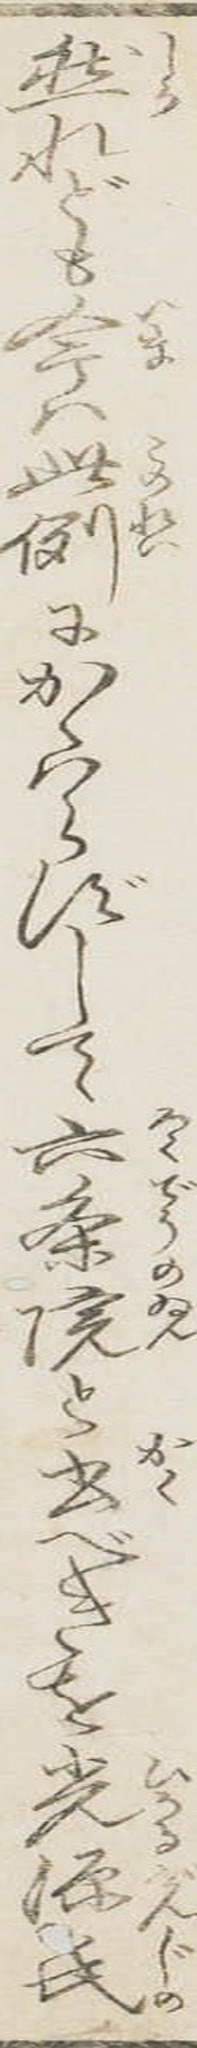然れども今は此例にかゝはらずして六条院と書べきを光源氏
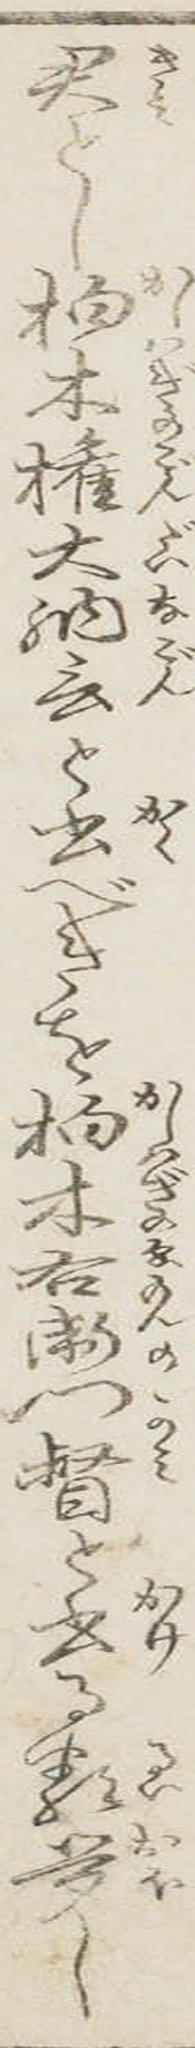君とし柏木権大納言と書べきを柏木右衛門督と書る類多し
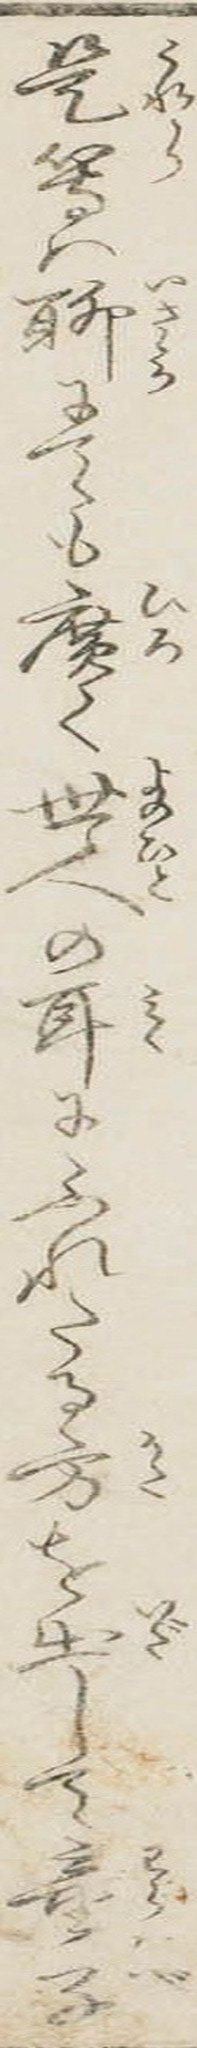是等は聊にても広く世人の耳にふれたる方を出して童子
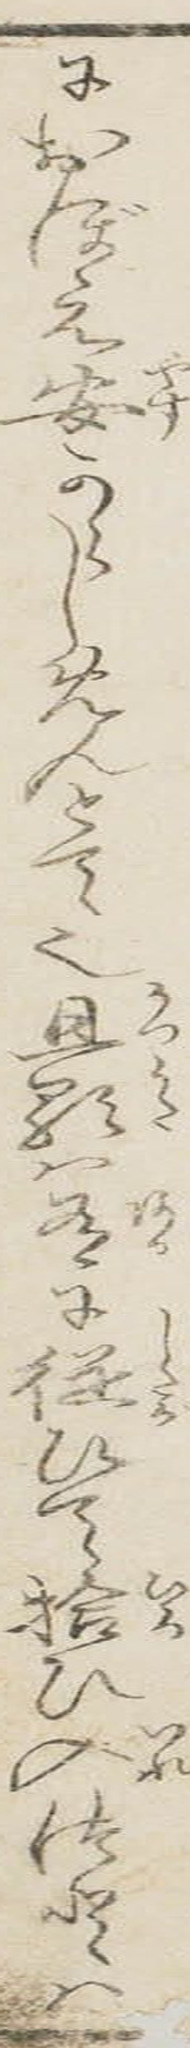におぼえ安からしめんとて也且歌は有に従ひて拾ひ入つとは
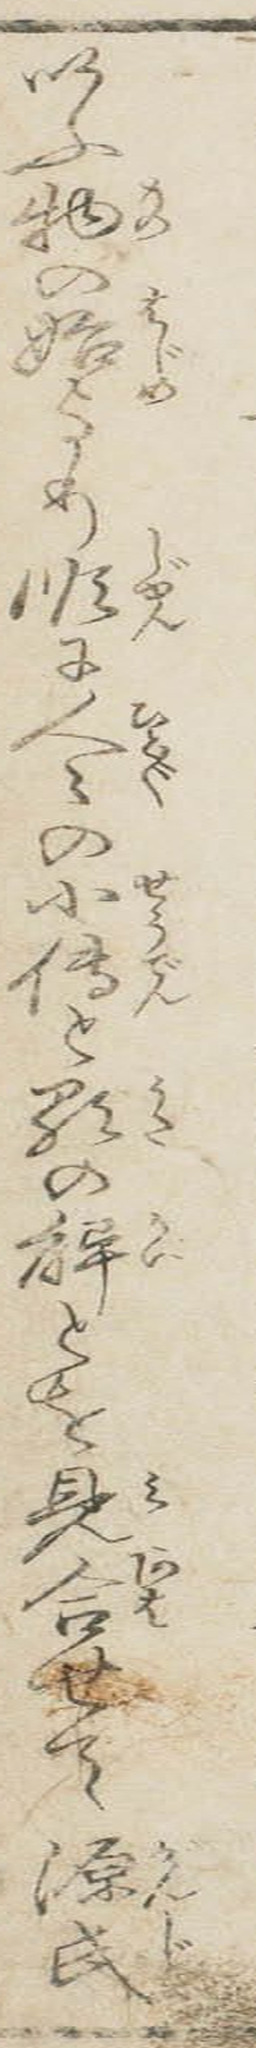いふ物の始より順に人々の小伝と歌の解とを見合せて源氏

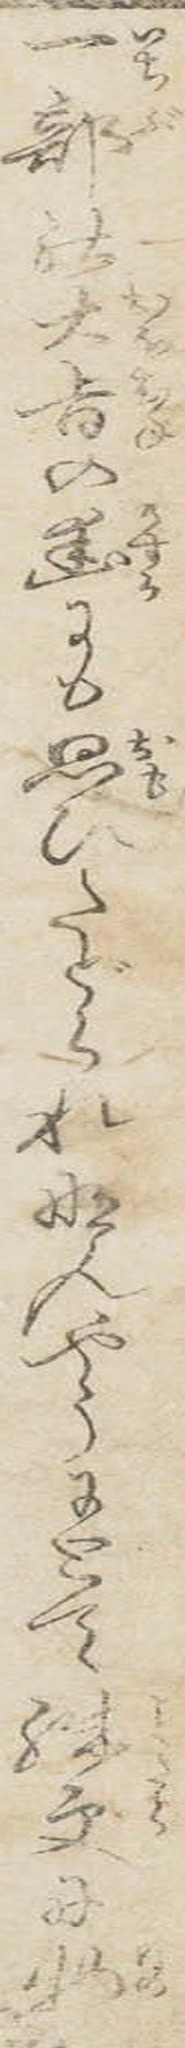一部の大旨の幽にも思ひたどられなんやうにとて殊更に物
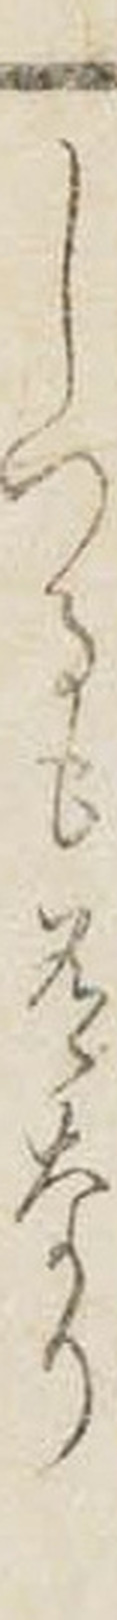しつるも有なり
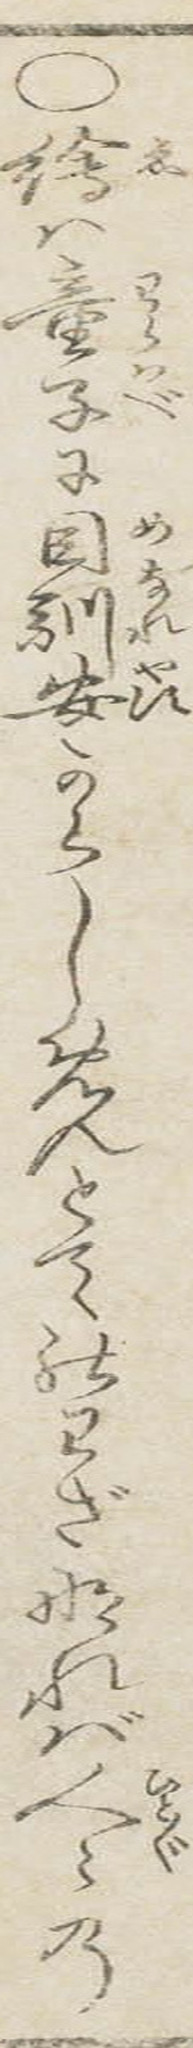○絵は童子に目馴安からしめんとてのわざなれば人々の
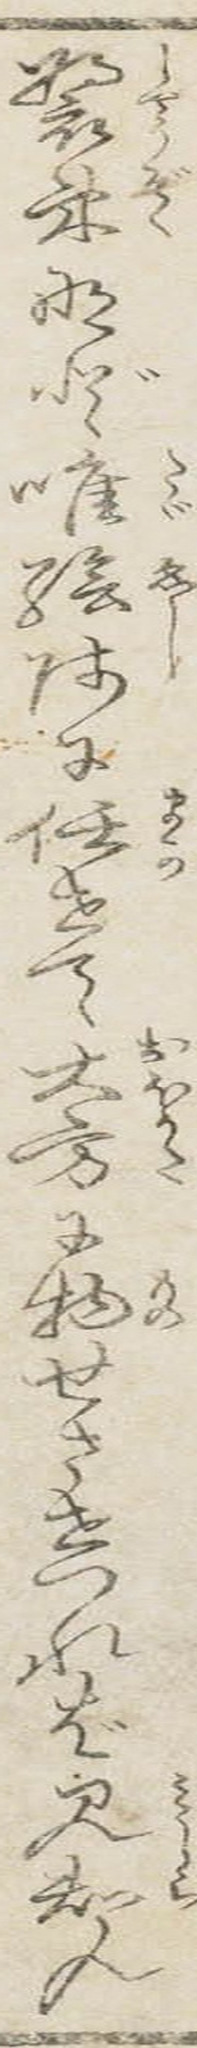装束など唯絵師に任せて大方に物せさせつれば見知ん
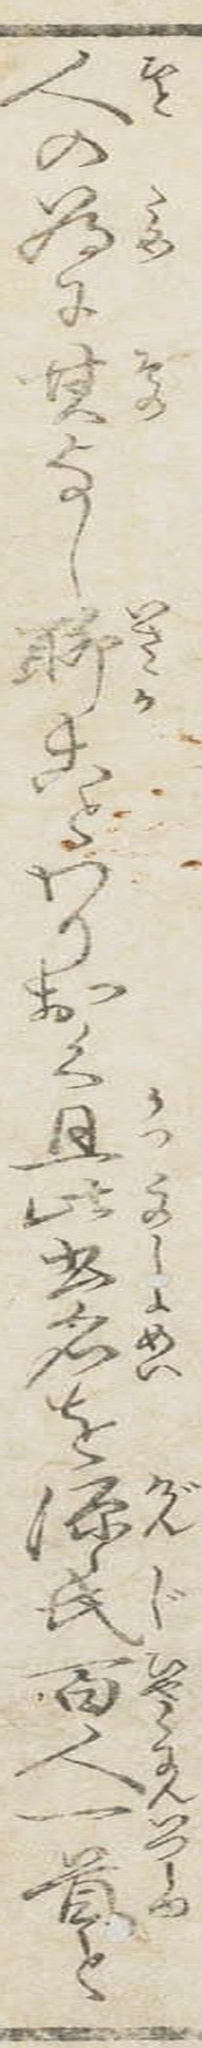人の為に其よし聊ことわりおく且此書名を源氏百人一首と
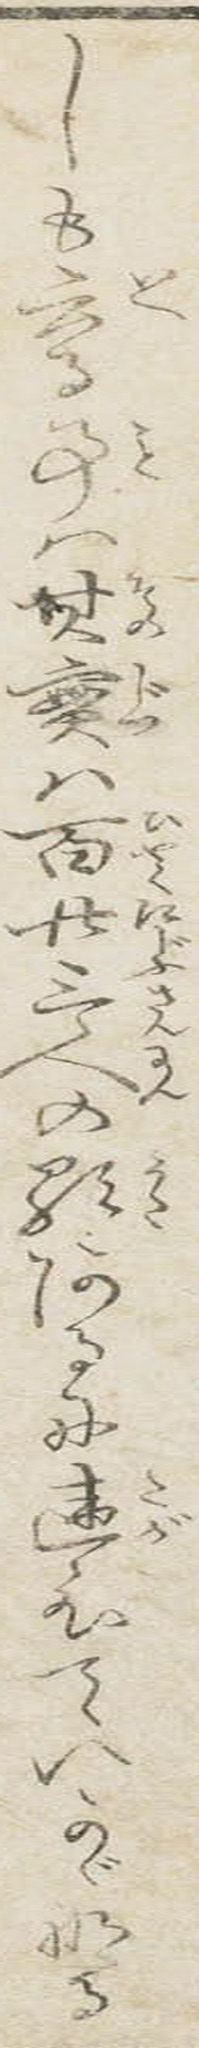しも云る事は其実は百廿三人の歌あるに違ひていかゞなる
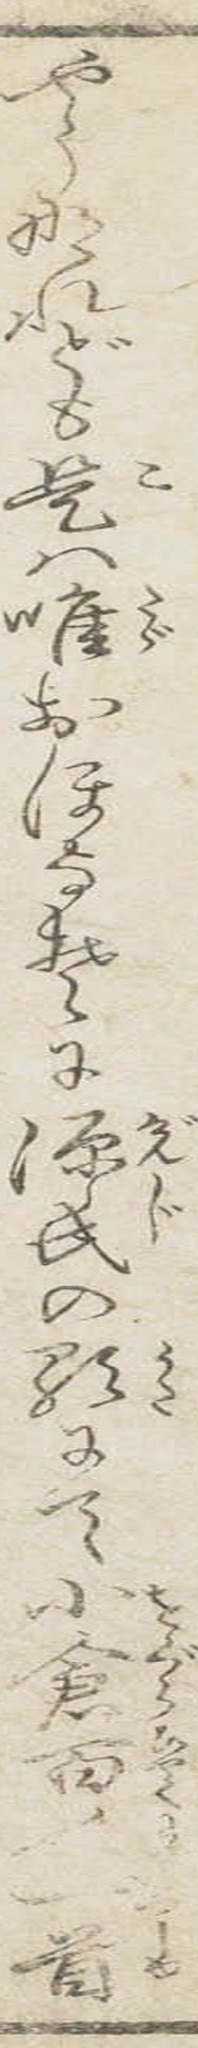やうなれども是は唯おほよそに源氏の歌にて小倉百人一首
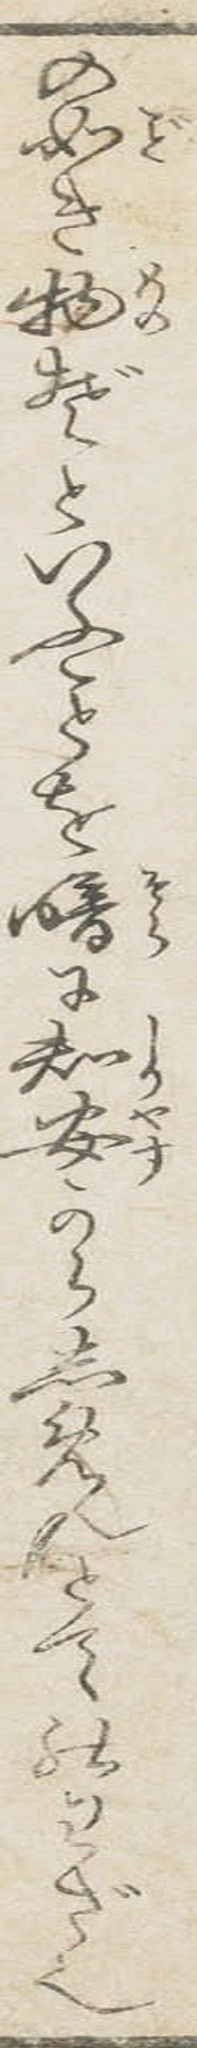の如き物ぞといふことを暗に知安からしめんとてのわざ也
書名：源氏百人一首
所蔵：東京学芸大学教育コンテンツアーカイブ
